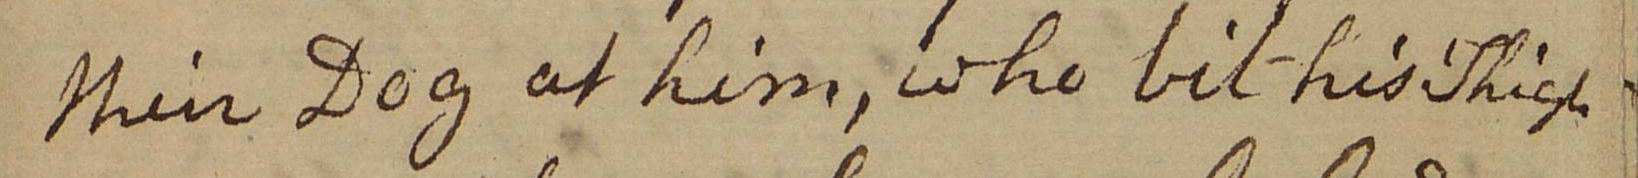their Dog at him, who bit his Thigh
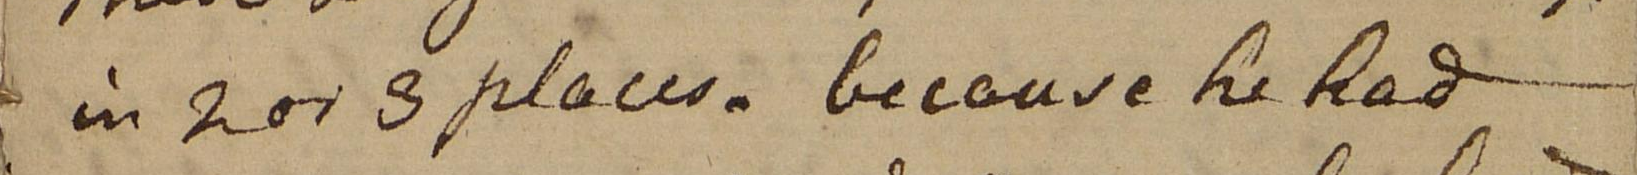in 2 or 3 places, because he had
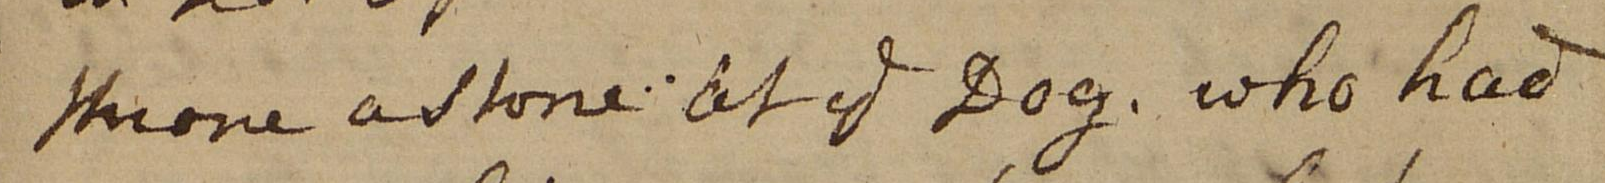throne a stone at y^e Dog. who had
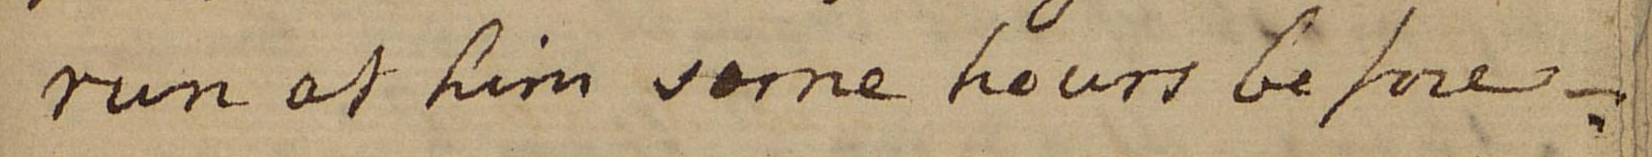run at him some hours be fore-
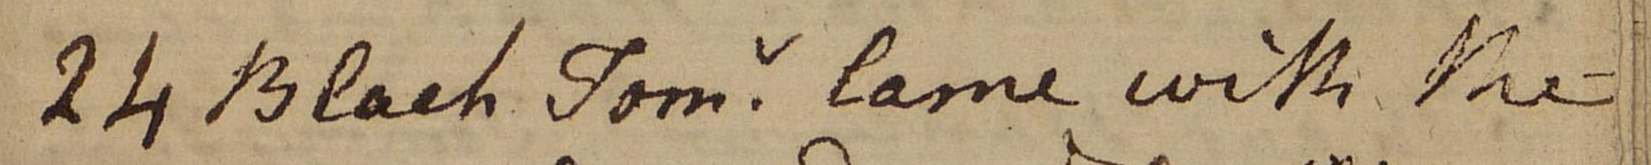24 Black Tom^s. lame with the-
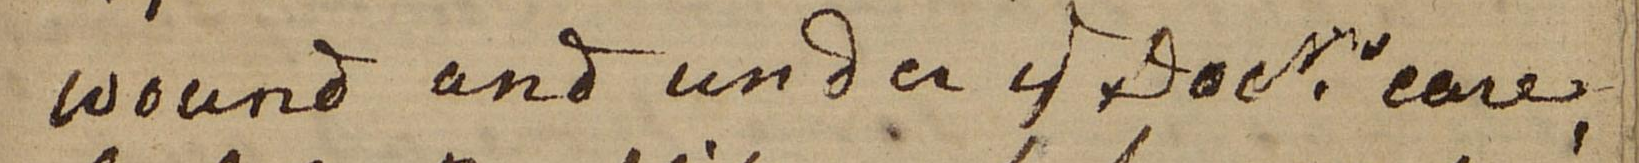wound and under y^e Doc^rs. care
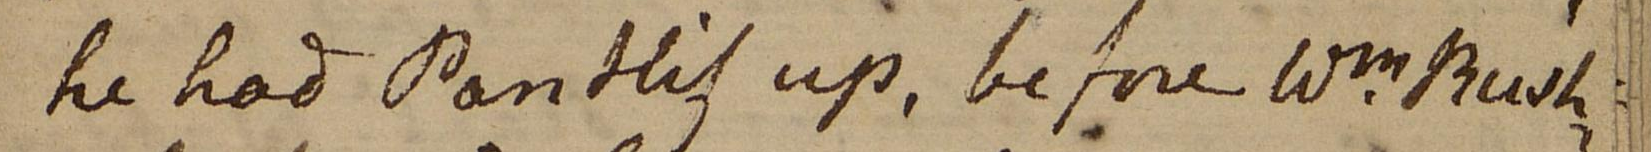he had Pantlif up, be fore W^m. Rush
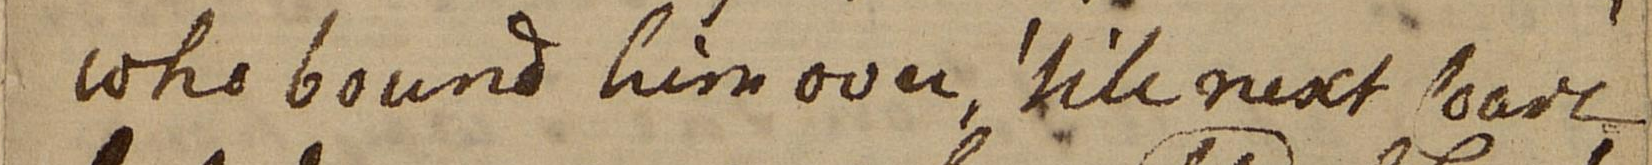who bound him over, 'till next Coar
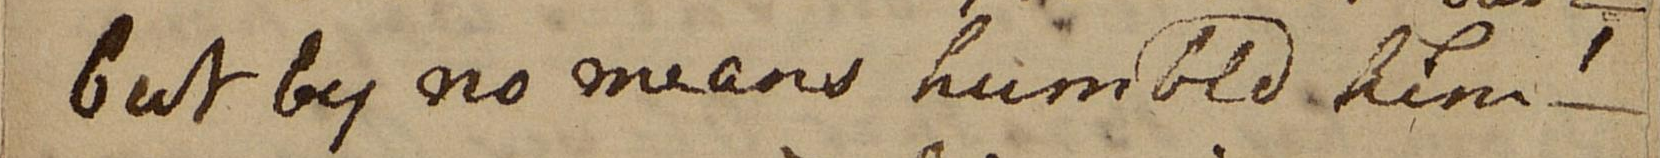but by no means humbld him-
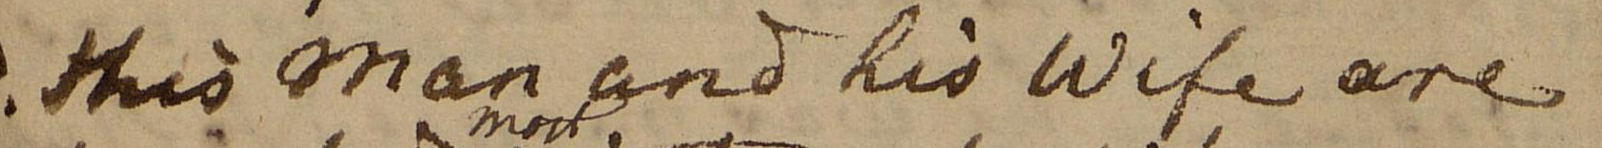this Man and his wife are
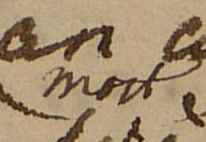most
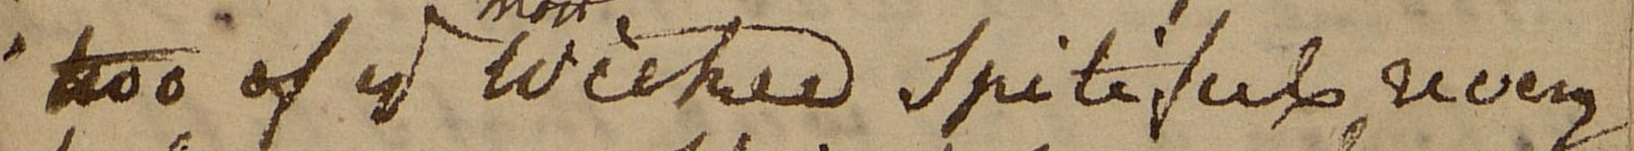two of y^e Wicked Spitiful revery
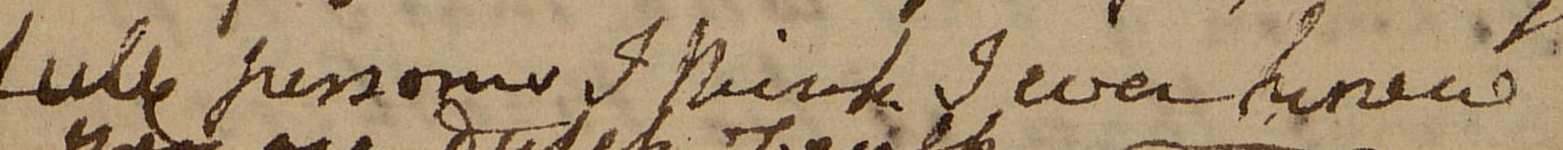full persons I think I ever knew
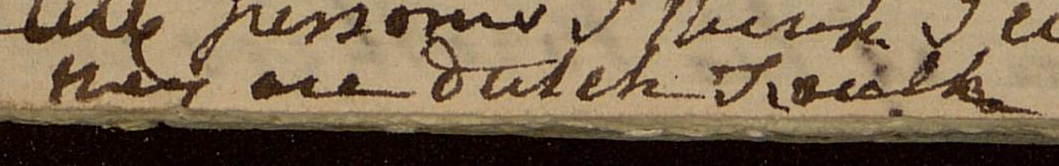they are dutch Foulk
